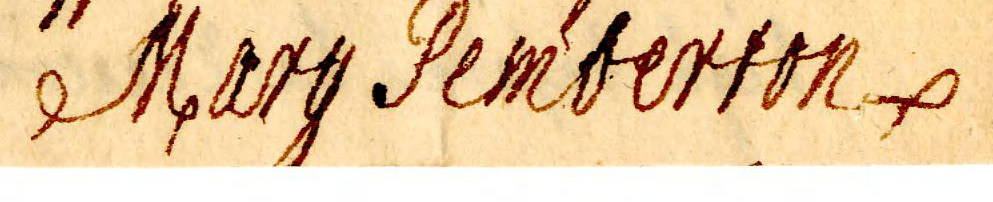Mary Pemberton
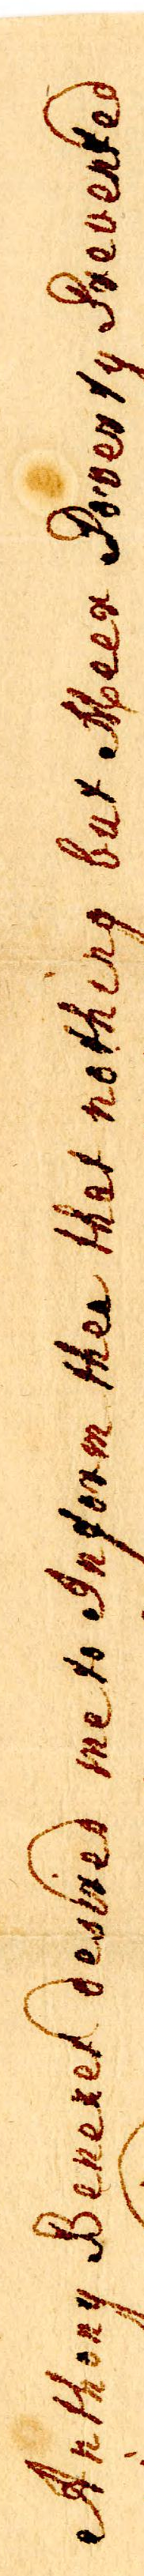Anthony Benezet desired me to Inform thee that nothing but sheer Poverty Prevented
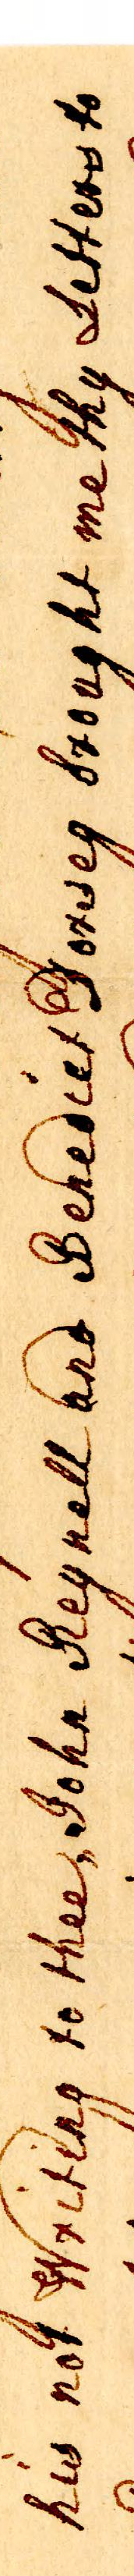his not Writing to thee, John Reynell and Benedict Dorsey brought me thy Letters to
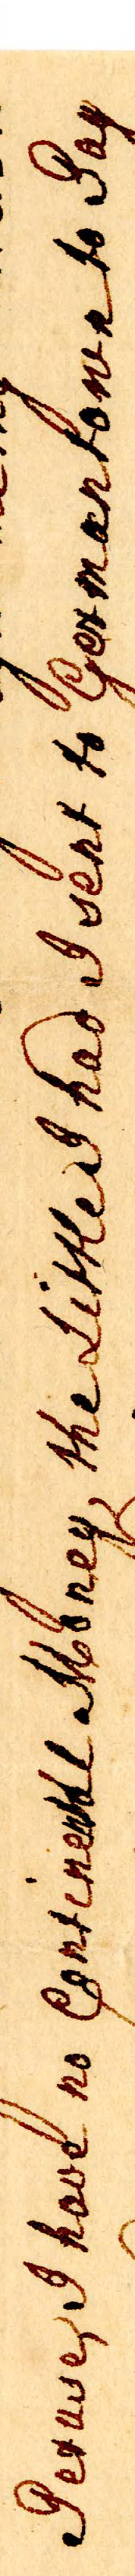Peruse, I have no Continental Money, the Little I had I sent to Germantown to Pay
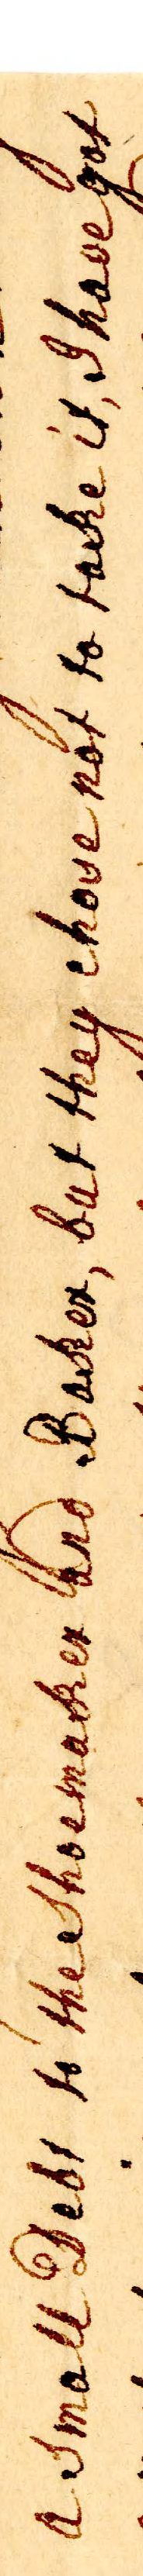a small Debt to the shoemaker and Baker, but they chose not to take it, I have got
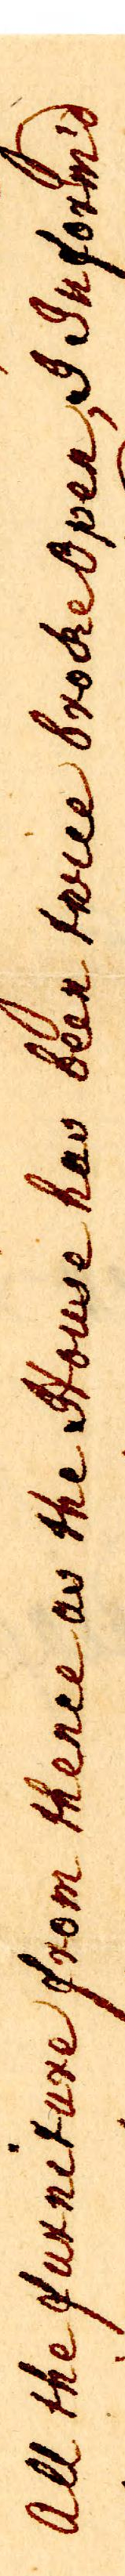All the furniture from thence as the House has been twice broke Open, I Inform'd
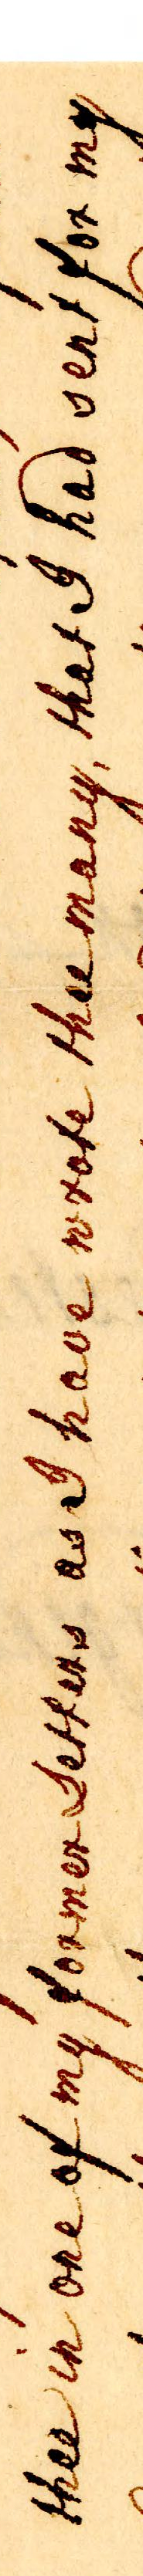thee in one of my former Letters as I have wrote thee many, that I had sent for my
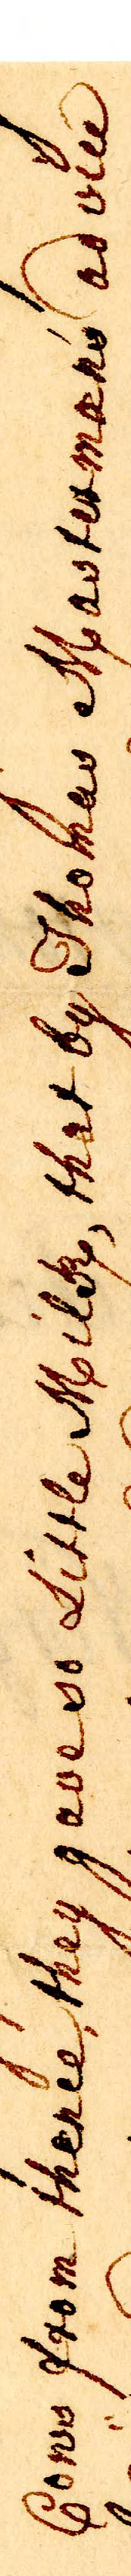Cows from thence, they gave so Little Milk, that by Thomas Masterman's advice
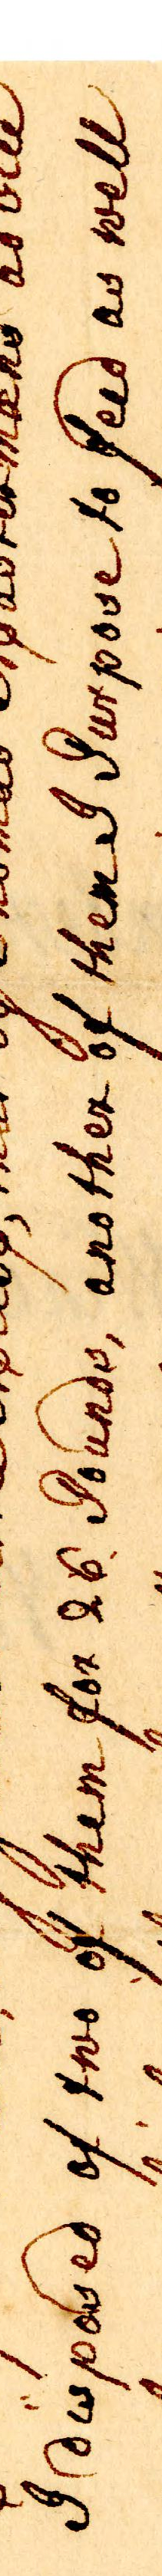I disposed of two of them for 26 Pounds, another of them I Purpose to feed as well
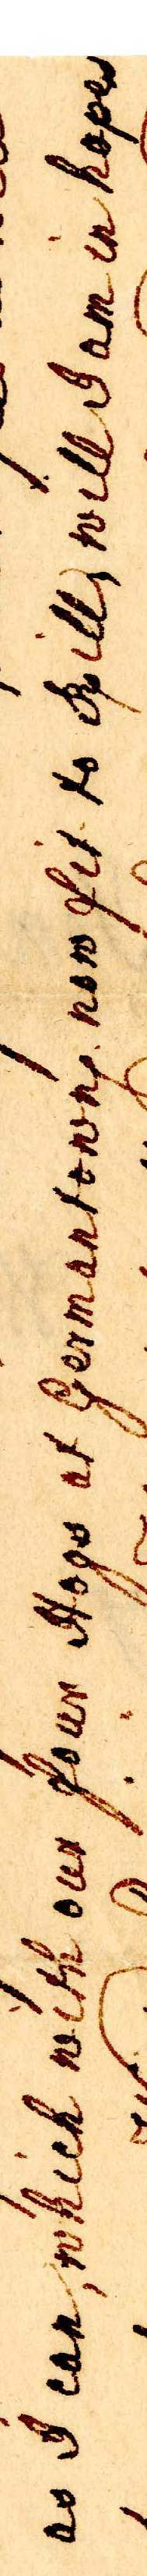as I can, which with our four Hogs at Germantown now fit to kill, will I am in hopes
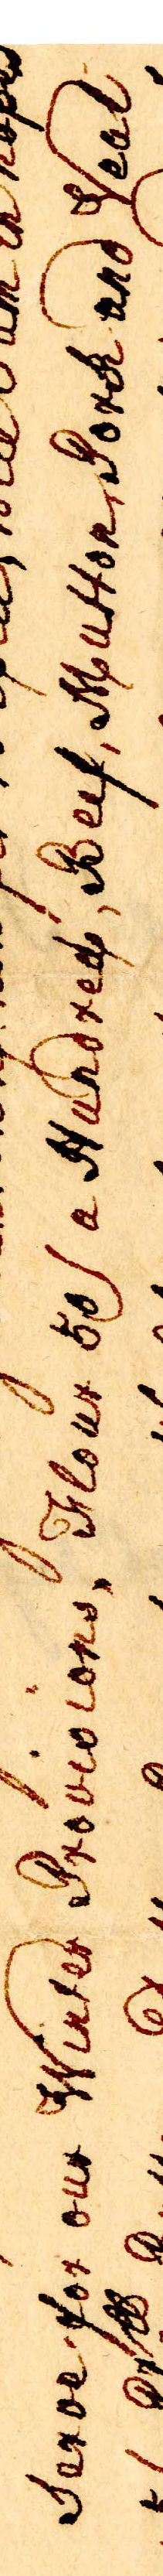Serve for our Winter Provisions, Flour 50s a Hundred, Beef, Mutton, Pork and Veal
